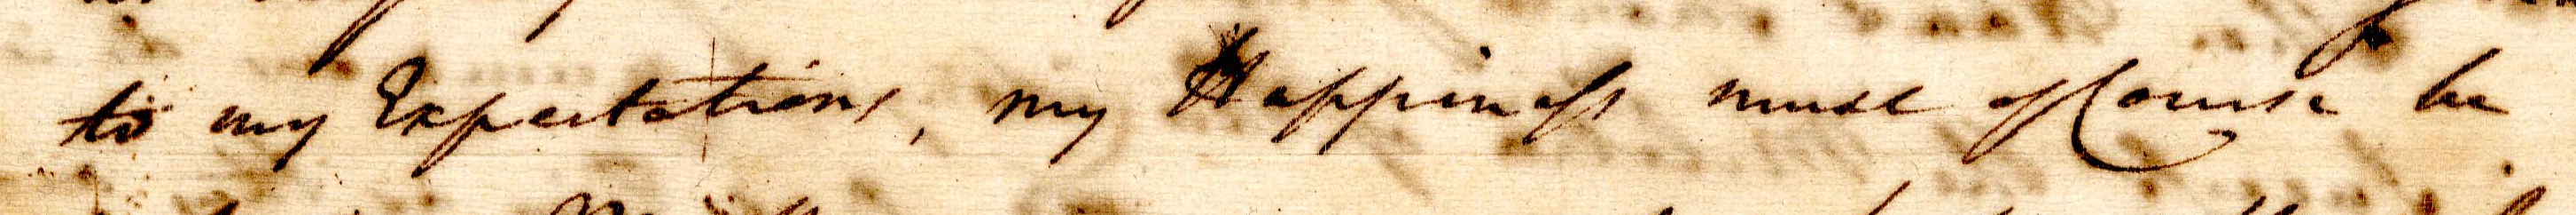to my Expectations, my Happiness must of Course be
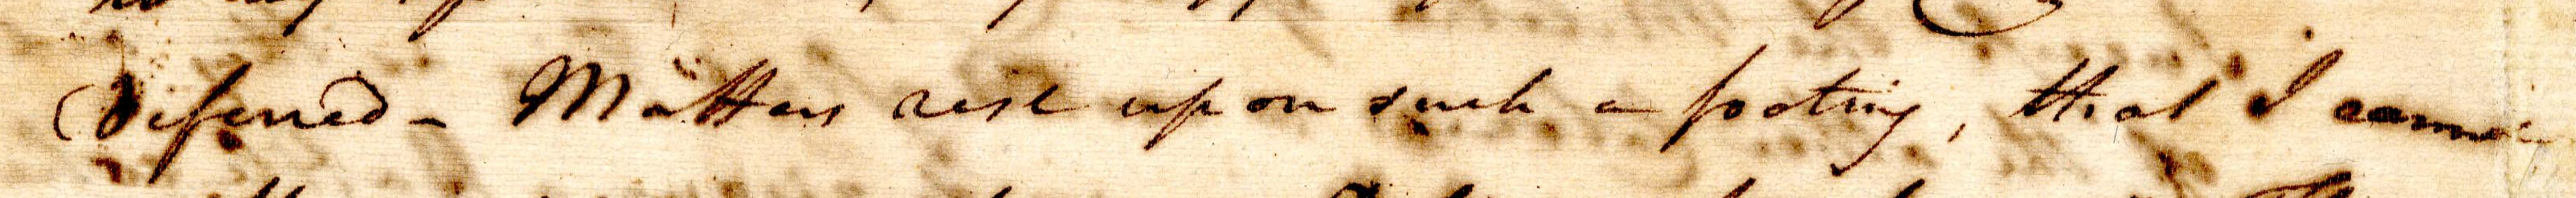deferred- Matters rest upon such a footing, that I cannot
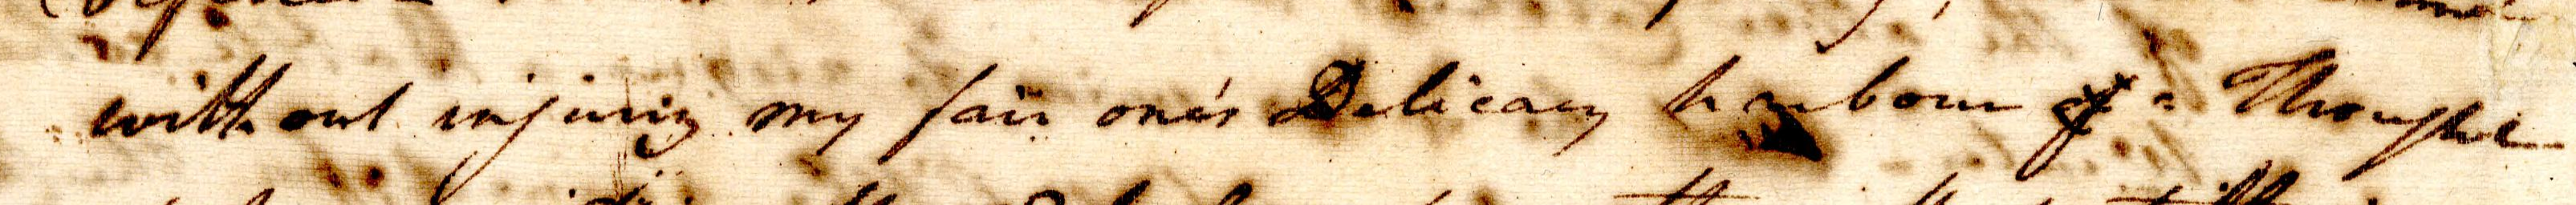without injuring my fair one's Delicacy harbour [_] a Thought
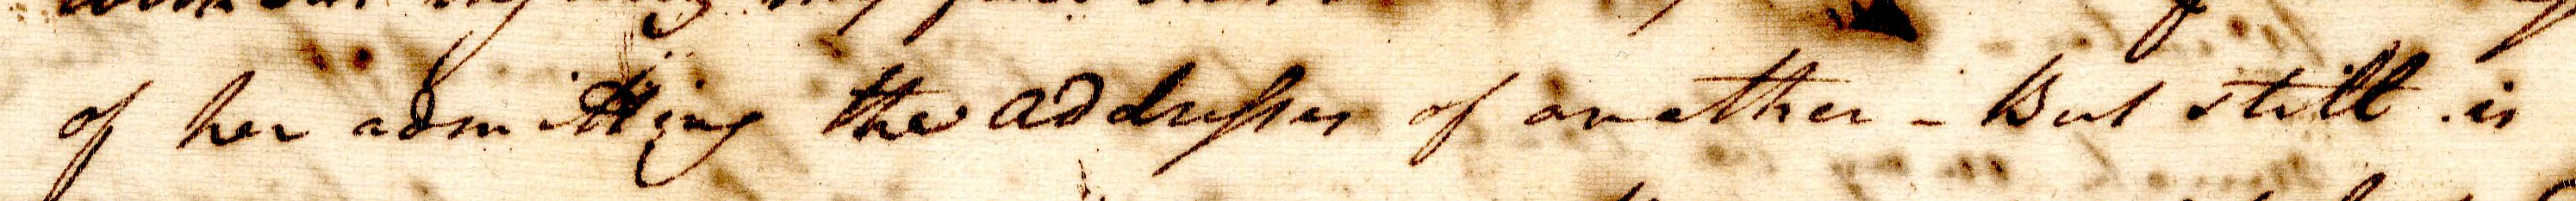of her admitting the addresses of another- But still is
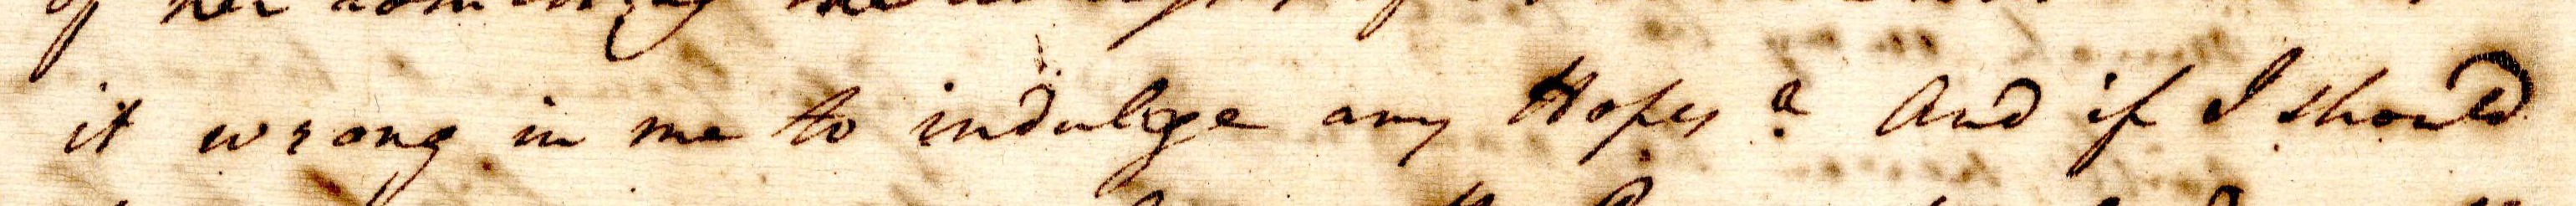it wrong in me to indulge any Hopes? And if I should
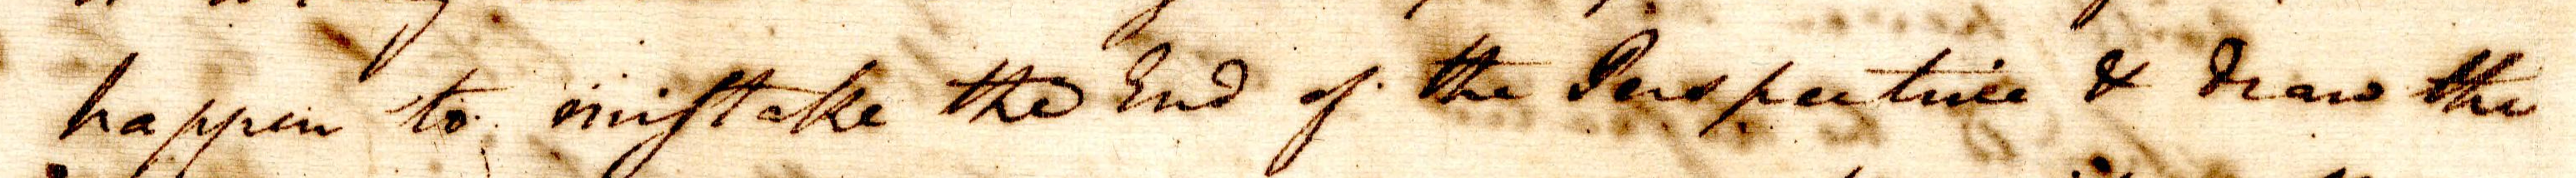happen to mistake the End of the Perspective & draw the
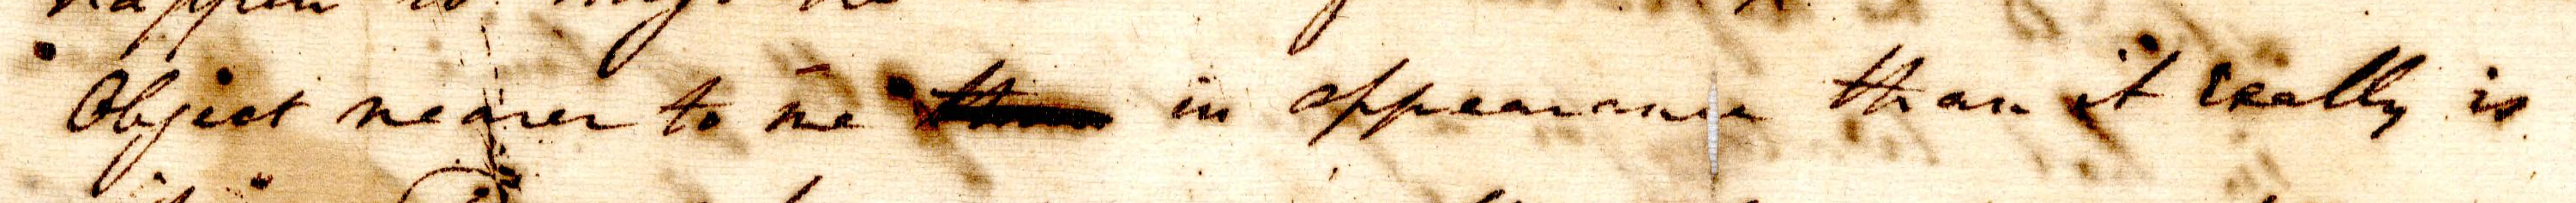Object nearer to me than in appearance than it really is
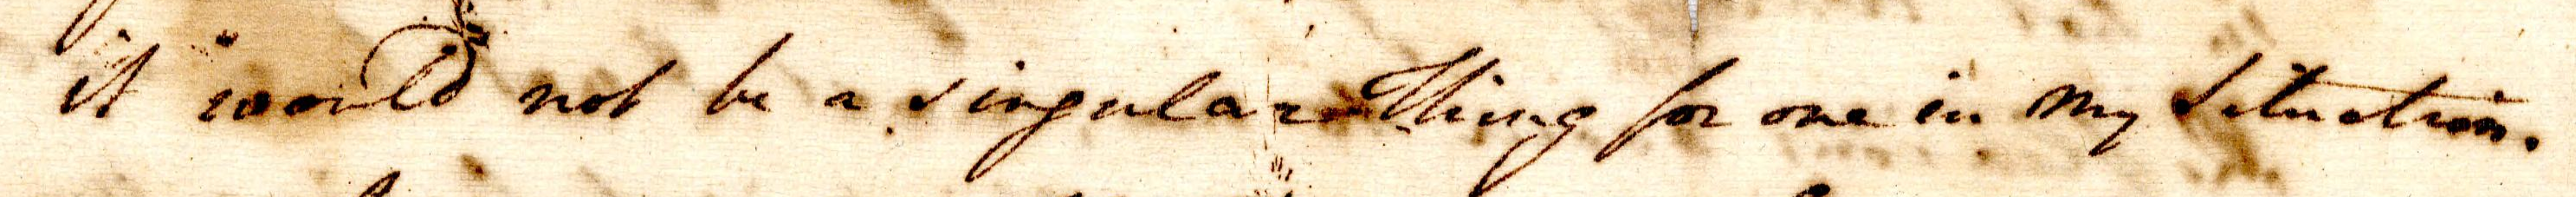it would not be a singular thing for one in my Situation.
